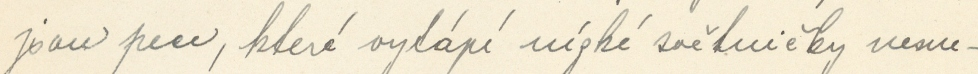jsou pece, které vytápí nízké světničky nesne-
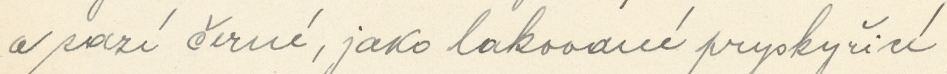a sazí černé, jako lakované pryskyřicí.
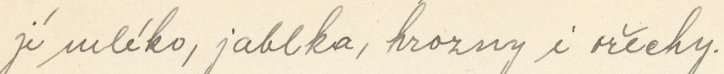jí mléko, jablka, hrozny i ořechy.
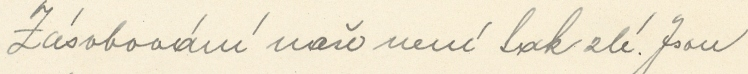Zásobování naše není tak zlé. Jsou
